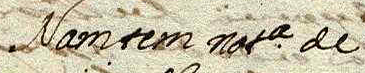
Nam tem not.a de
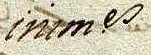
inim.es
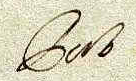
Pub
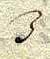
3
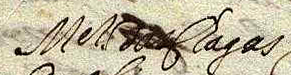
Mell das Chagas
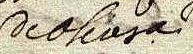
de olivr.a
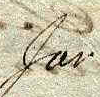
Jur
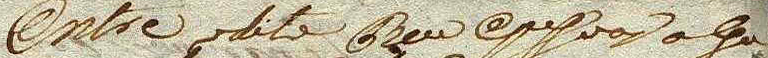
entre o dito Reu e pessoas algu
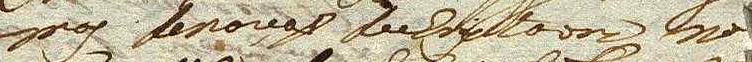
mas de naçaõ de christaons no
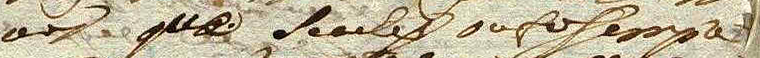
uos que se achaõ ou fossem pre
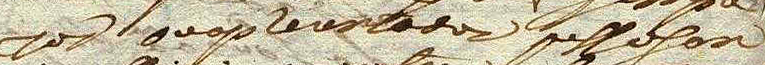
zos ou aprezentados pello san
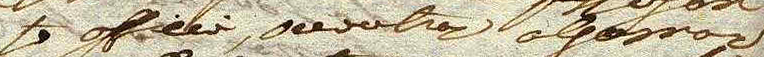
to officio, ou outras algumas
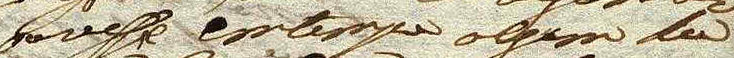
ouvesse em tempo algum du
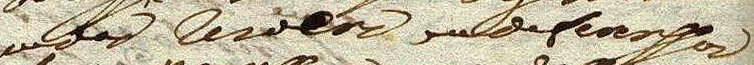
uidas Rezoens ou deferenssas
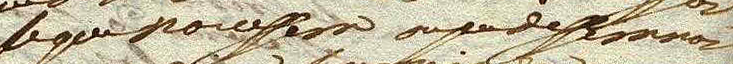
de que nascessem ou pudessem nas
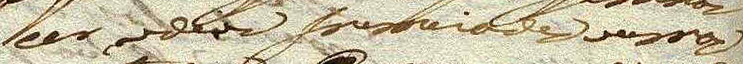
cer odeos Jnemizades ou mas
